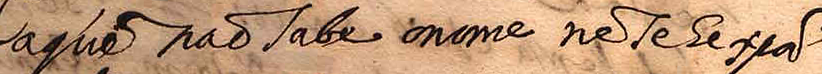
a quē naõ sabe o nome nē se he xpā
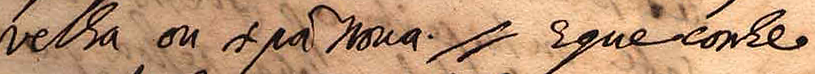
velha ou xpā noua. // E que conhe
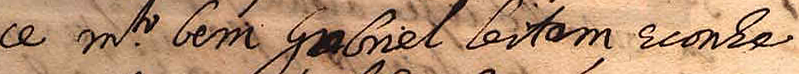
ce m.to bem Gabriel leitam, E conhe
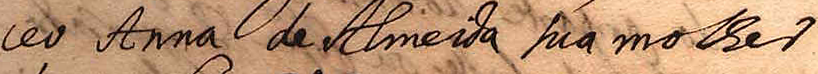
ceo Anna de Almeida sua molher
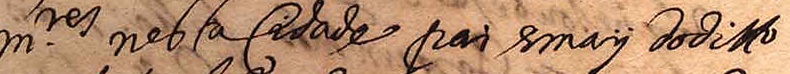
m.res nesta Cidade pai E may do ditto
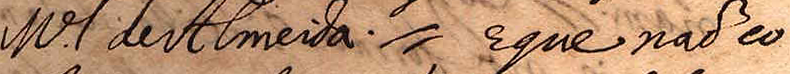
M.el de Almeida. // E que naõ co
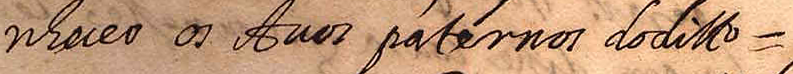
nheceo os Auos paternos do ditto
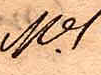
M.el
